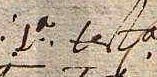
1.ª testa.
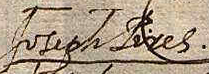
Joseph Pires.
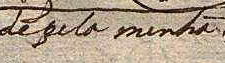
de pela menhã.
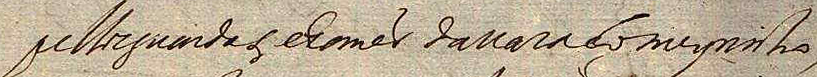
pellos guardas e homes̄ da uara do meyrinho,
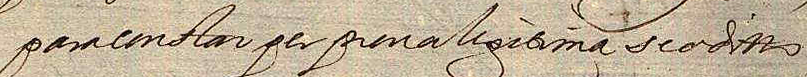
para constar per proua legitima se o ditto
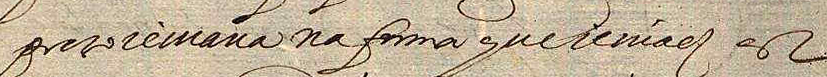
prezo ieiuaua na forma que ieiuaõ os
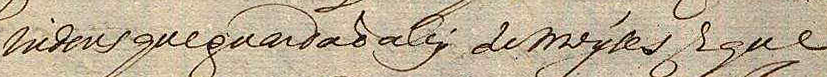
iudeus que guardaõ a ley de moyses E que
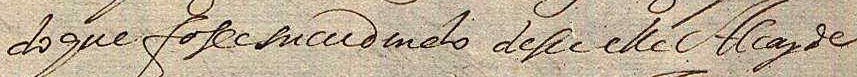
do que fose succedendo desse elle Alcayde
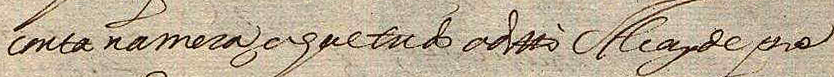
conta na meza e que tudo o ditto Alcayde pro
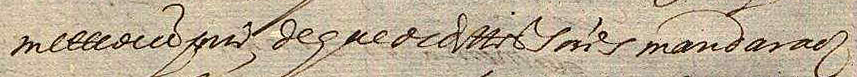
metteo cōprir, de que os dittos sores mandaraõ
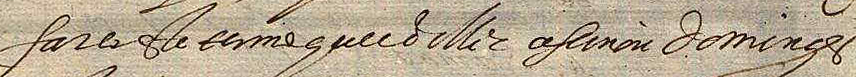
fazer este termo que cō elles assinou domingos
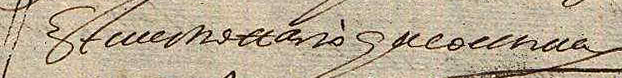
Esteues nottario que o escreuj.
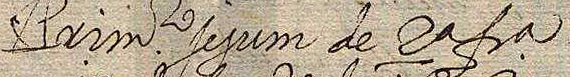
Prim.ro jejum de 2a fr.a
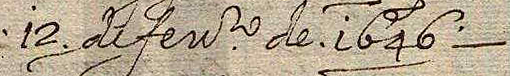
i2 de feu.ro de i646
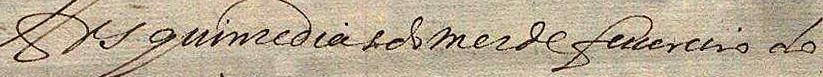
Aos quinze dias do mes de feuereiro do
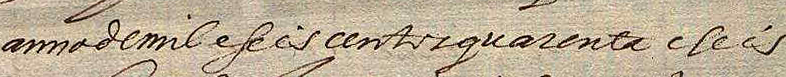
anno de mil e seiscentos quarenta e seis
